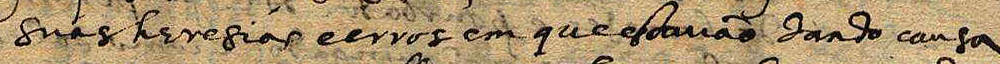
suas heresias e erros em que estauão dando causa
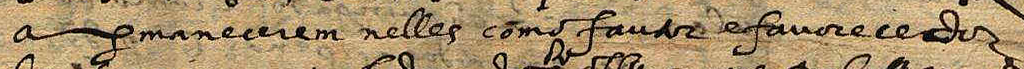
a ꝑmanecerem nelles como fautor e fauorecedor
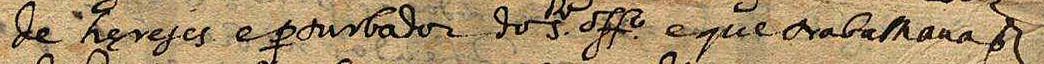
de herejes e ꝑturbador do s.to off.o e que trabalhaua pa
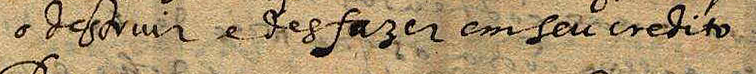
o destruir e desfazer em seu credito
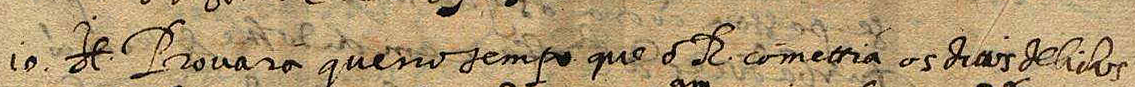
10. It. Prouara que no tempo que o R. comettia os dittos delictos
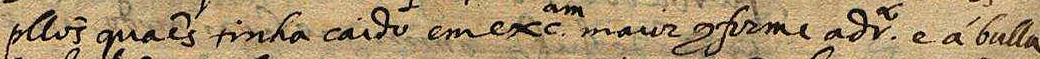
pllos̄ quaēs tinha caido em exc.am maior ꝯforme a drto. e a bulla
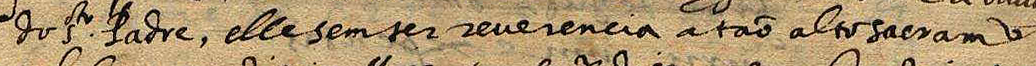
do sto. Padre, elle sem ter reuerencia a taõ alto sacramto
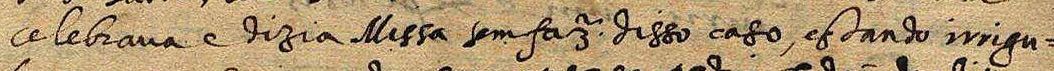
celebraua e dizia Missa sem faz̄. disso caso, estando irrigu
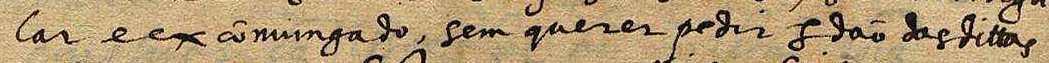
lar e excōmungado, sem querer pedir ꝑdaõ das dittas
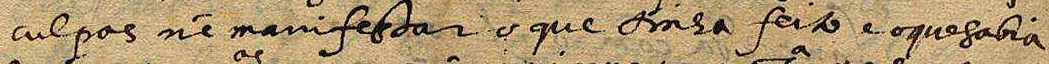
culpas ne̅ manifestar o que tinha feito e o que sabia
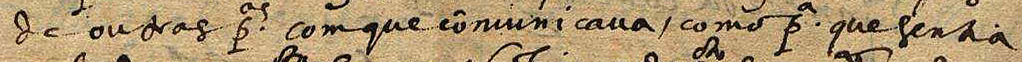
de outras pas. com que cōmunicaua / como pa. que sentia
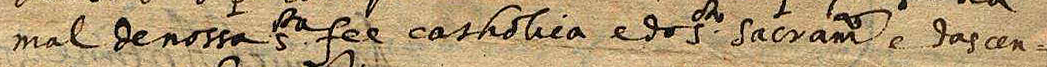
mal de nossa sta fee catholica e do scto. sacramto e das cen
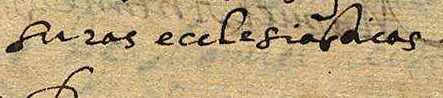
suras ecclesiasticas
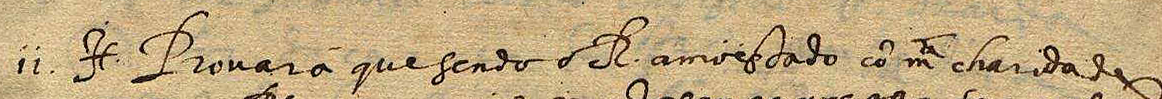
ii. Jt. Prouará que sendo o R. amoestado cō mta charidade
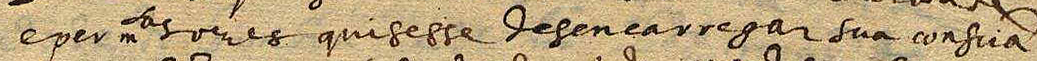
e per mtas vezes quisesse desencarregar sua consciā
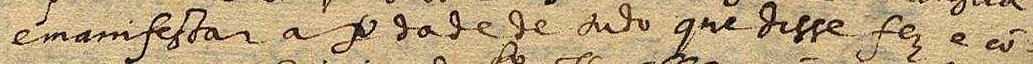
e manifestar a ꝟdade de tudo que disse fez e cō
